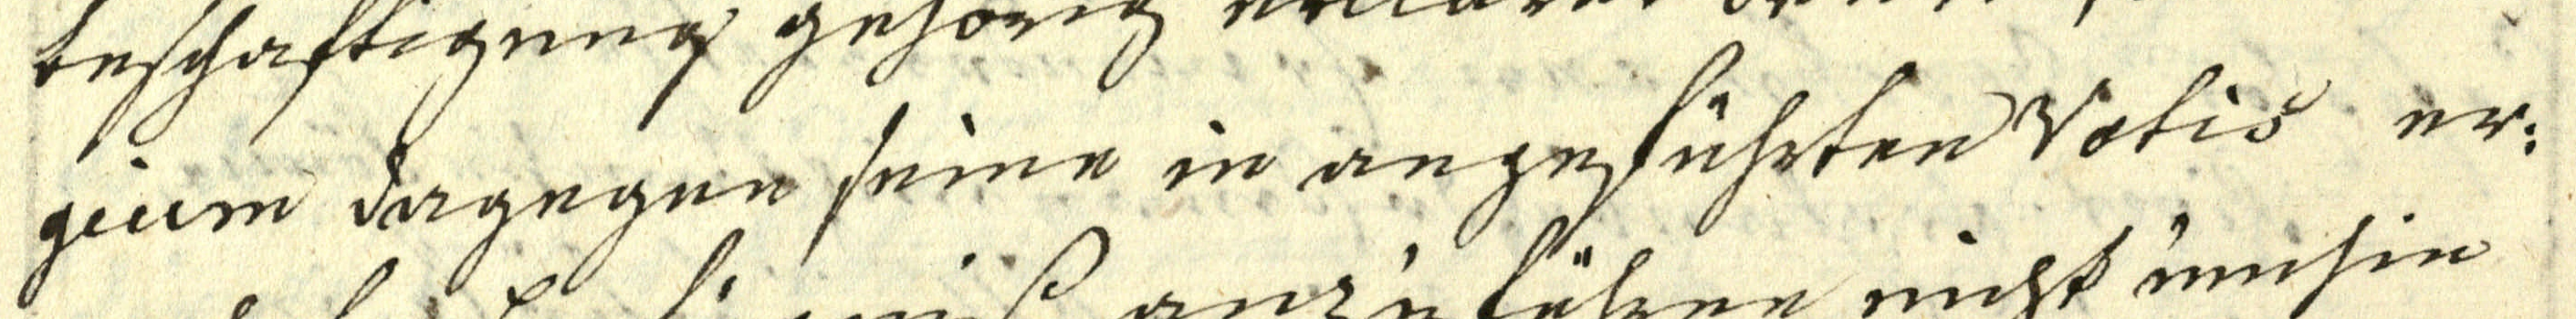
gium dagegen seine in angeführten Votis er¬
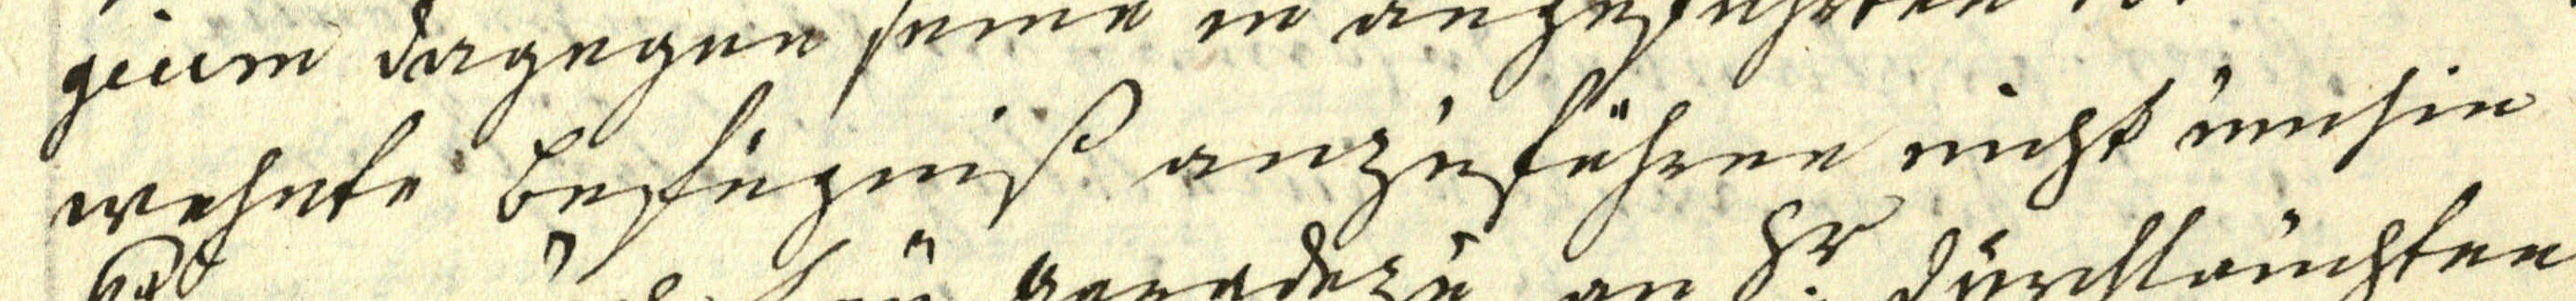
wehnte Befugniß anzuführen nicht umhin
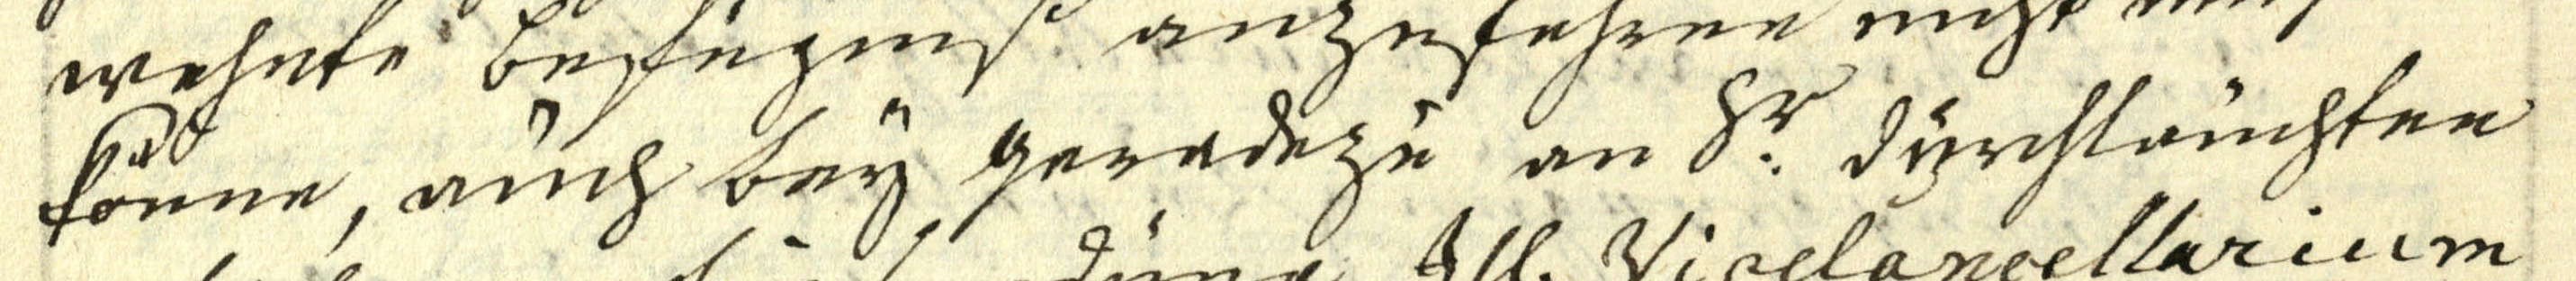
könne, auch beÿ geradezu an Sr Durchlauchten
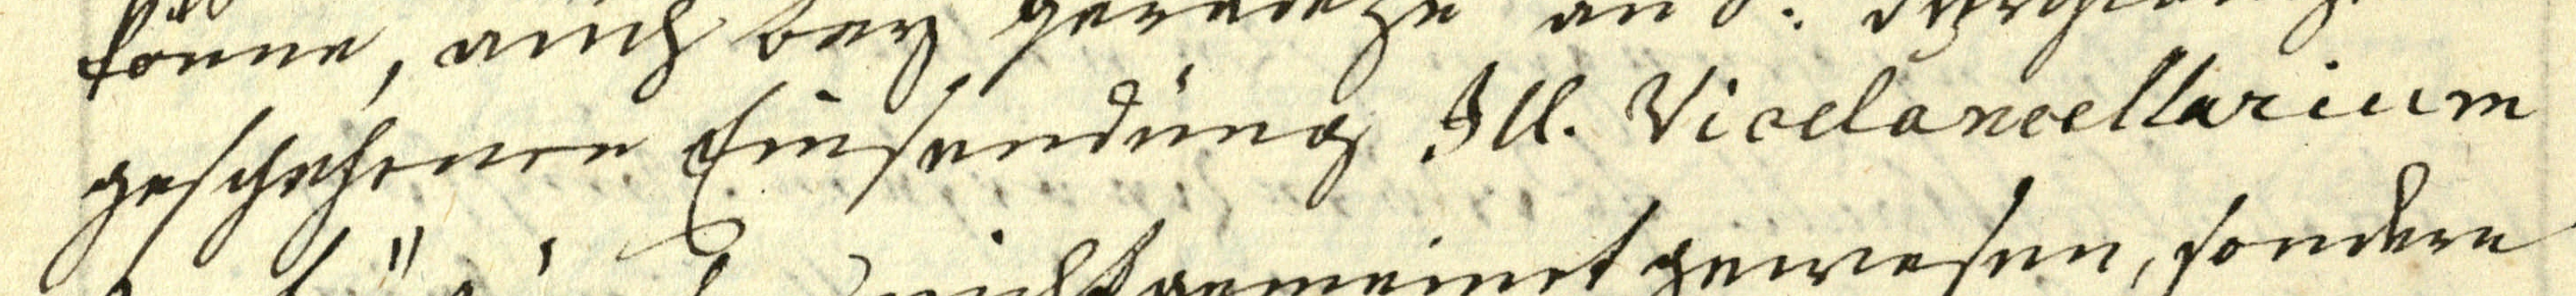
geschehenen Einsendung Ill. ViceCancellarium
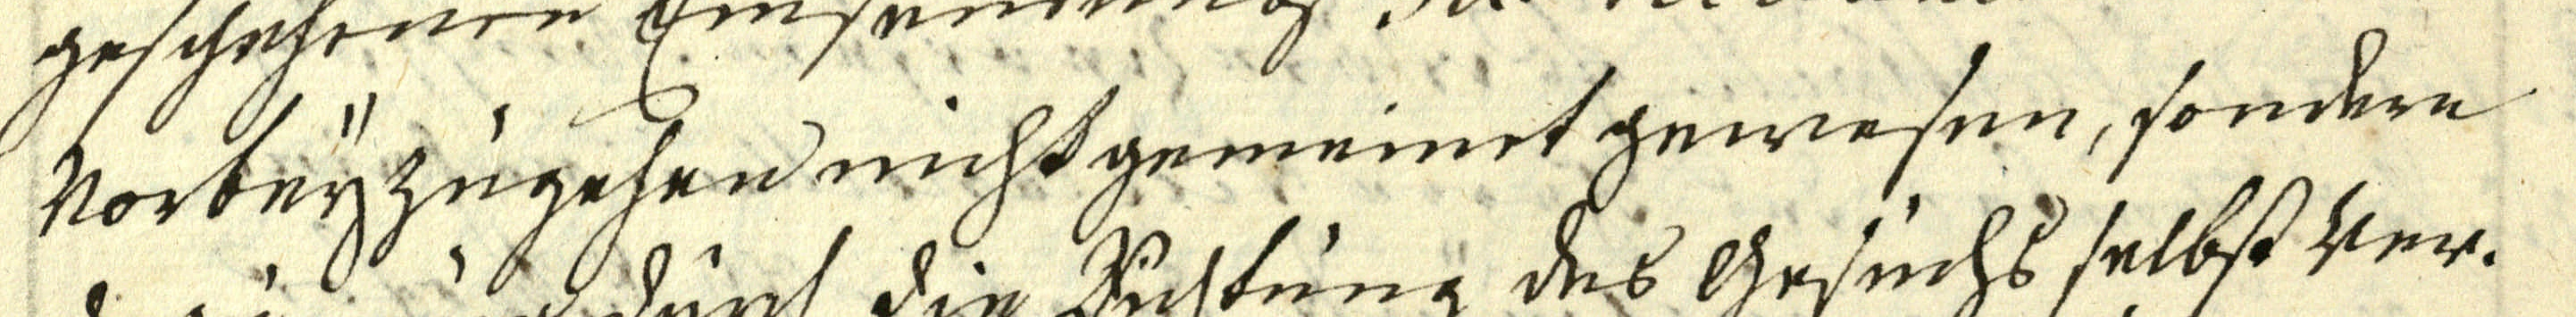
vorbeÿzugehen nicht gemeinet gewesen, sondern
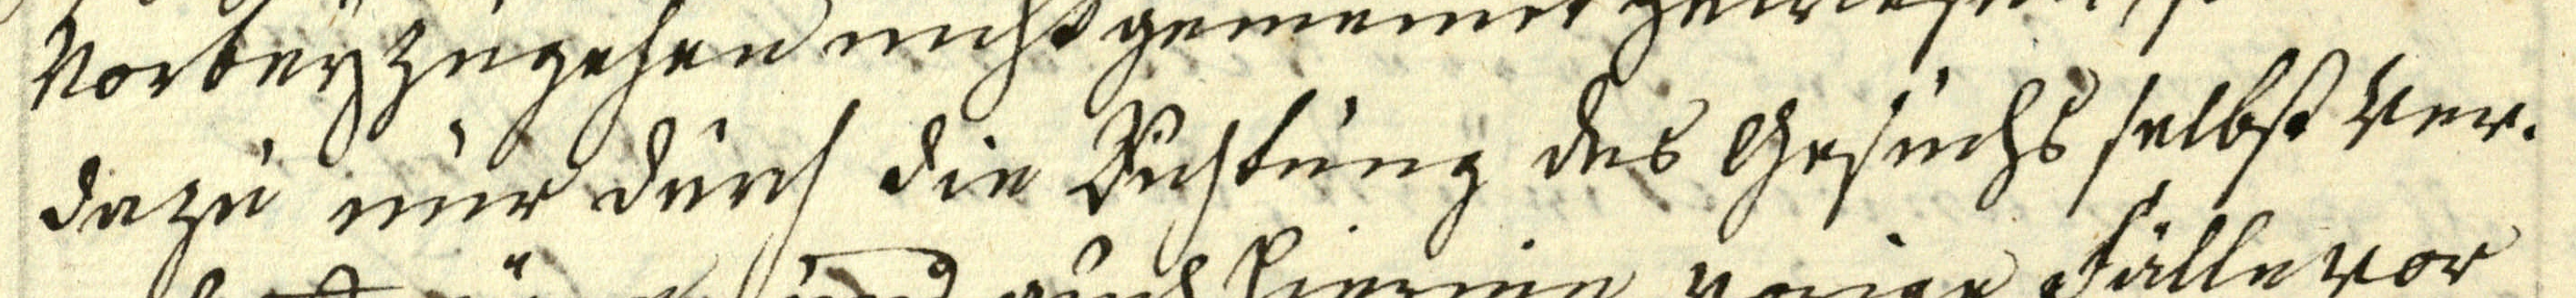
dazu nur durch die Richtung des Gesuchs selbst ver¬
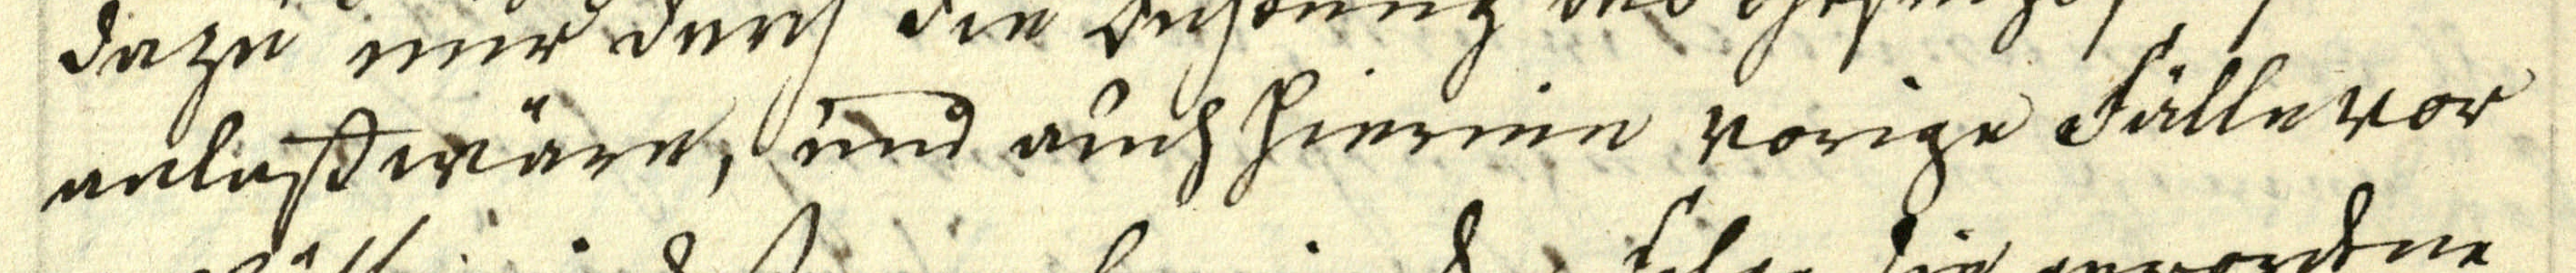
anlast wäre, und auch hierin vorige Fälle vor
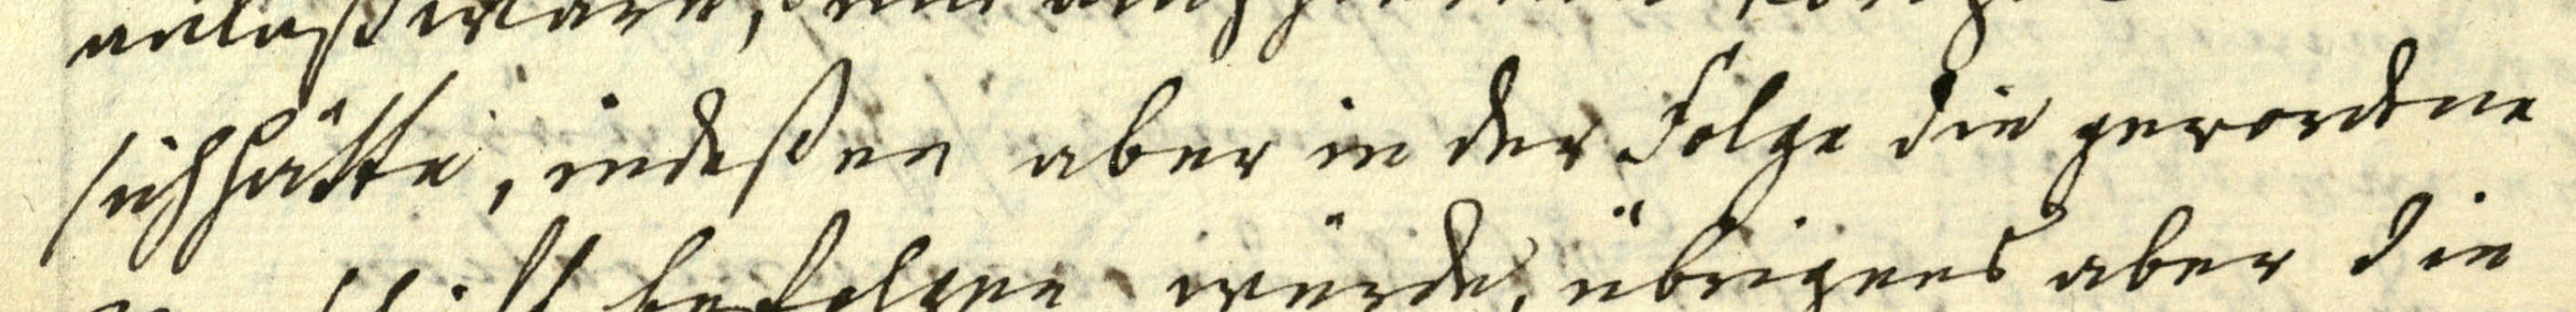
sich hätte, indeßen aber in der Folge die gewordene
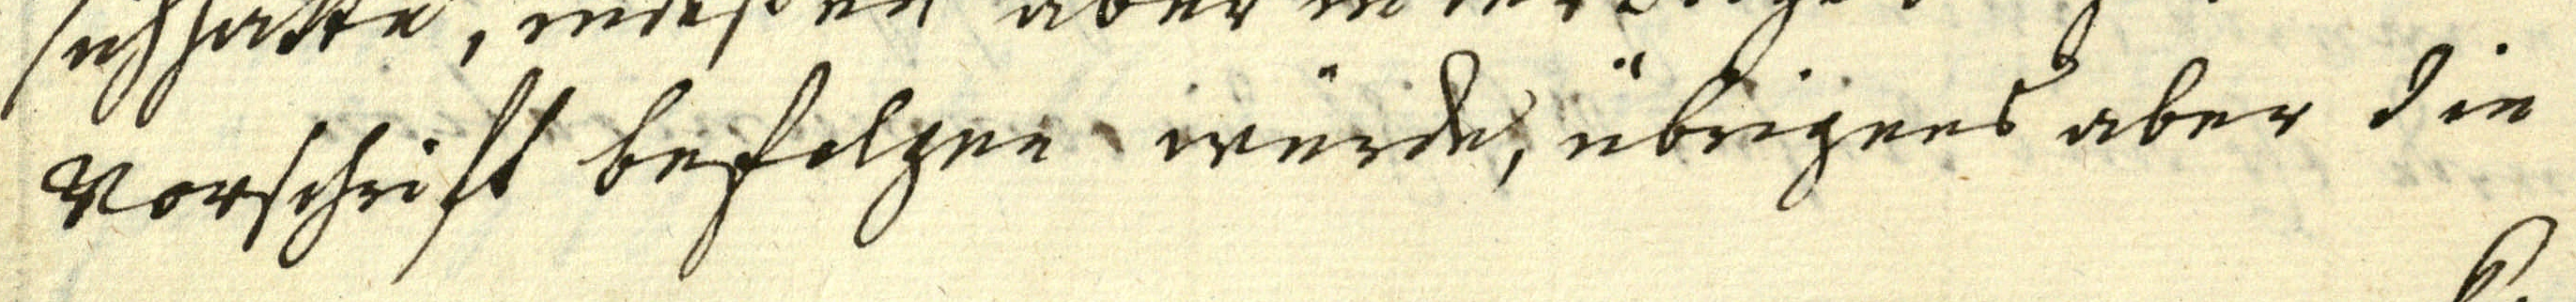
Vorschrift befolgen. würde, übrigens aber die
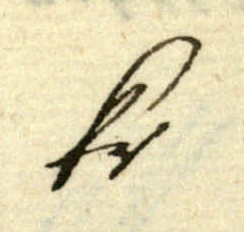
kr
